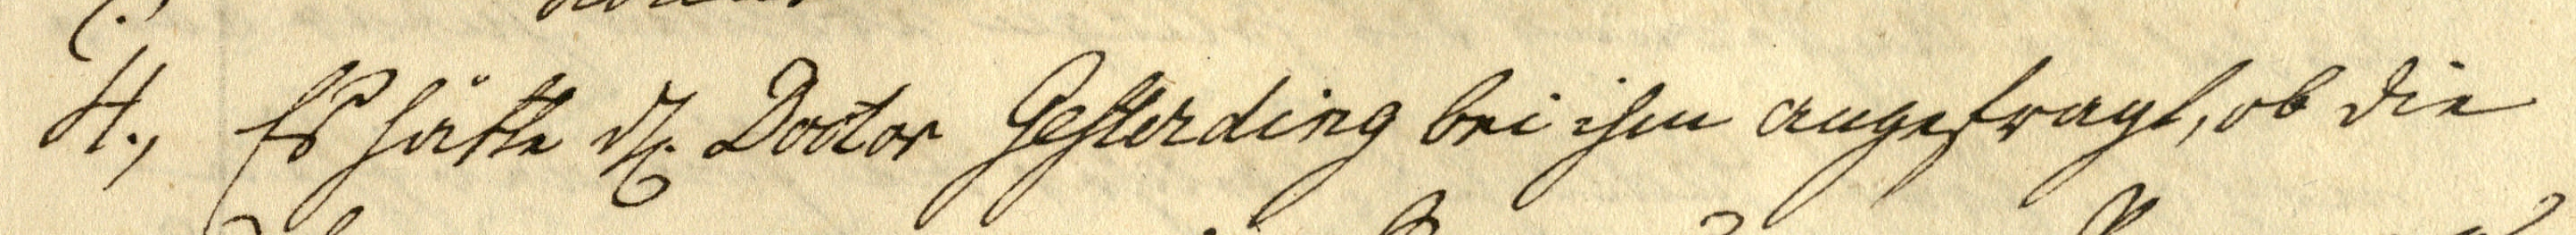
4. Es hätte dh. Doctor Gesterding bei ihm angefragt, ob die
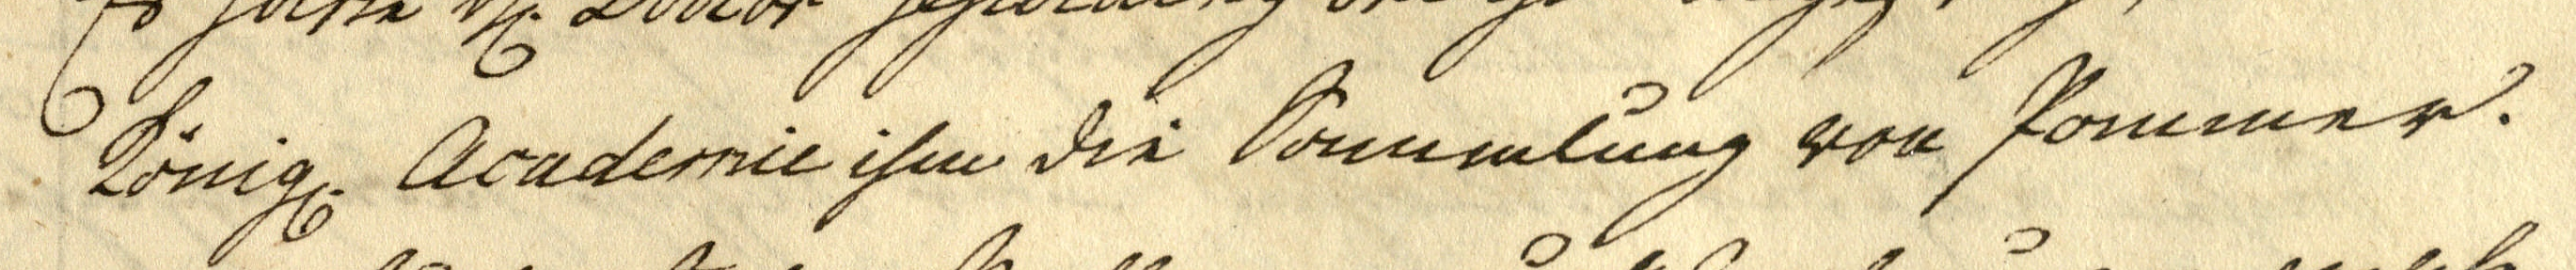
Königl. Academie ihm die Sammlung von Pommer-
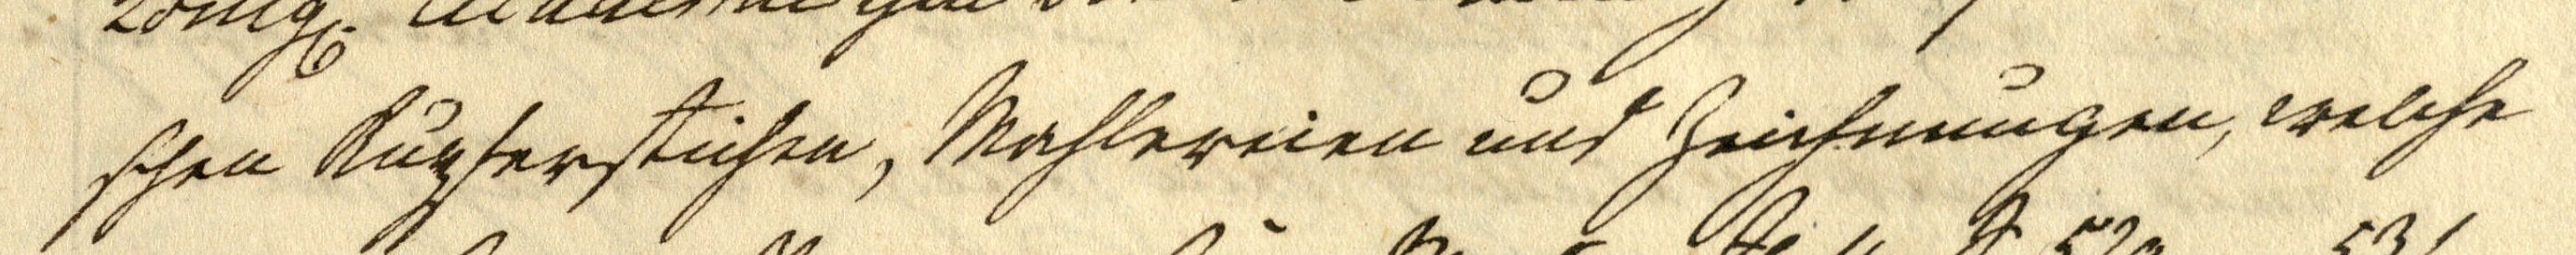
schen Kupferstichen, Mahlereien und Zeichnungen, welche
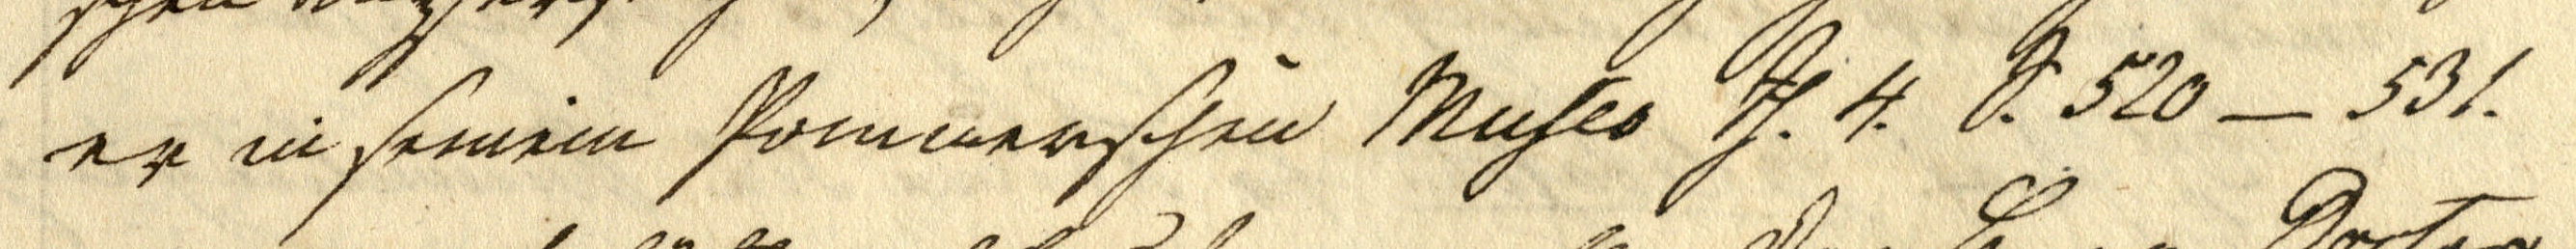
er in seinem Pommerschen Museo Th. 4. S. 520-531.
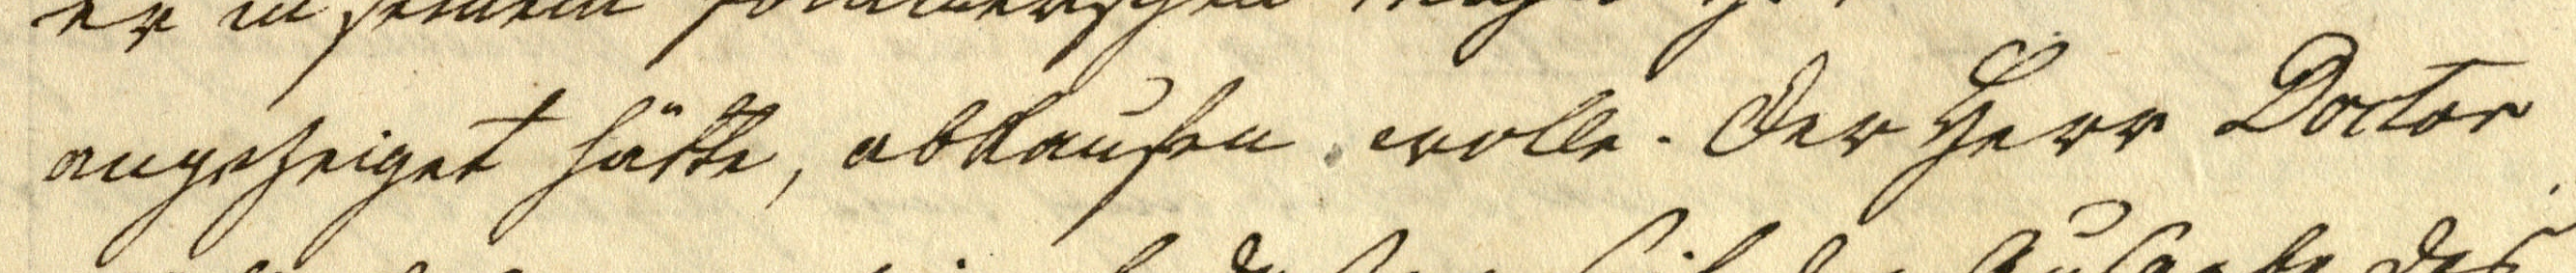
angezeiget hätte, abkaufen wolle. Der Herr Doctor
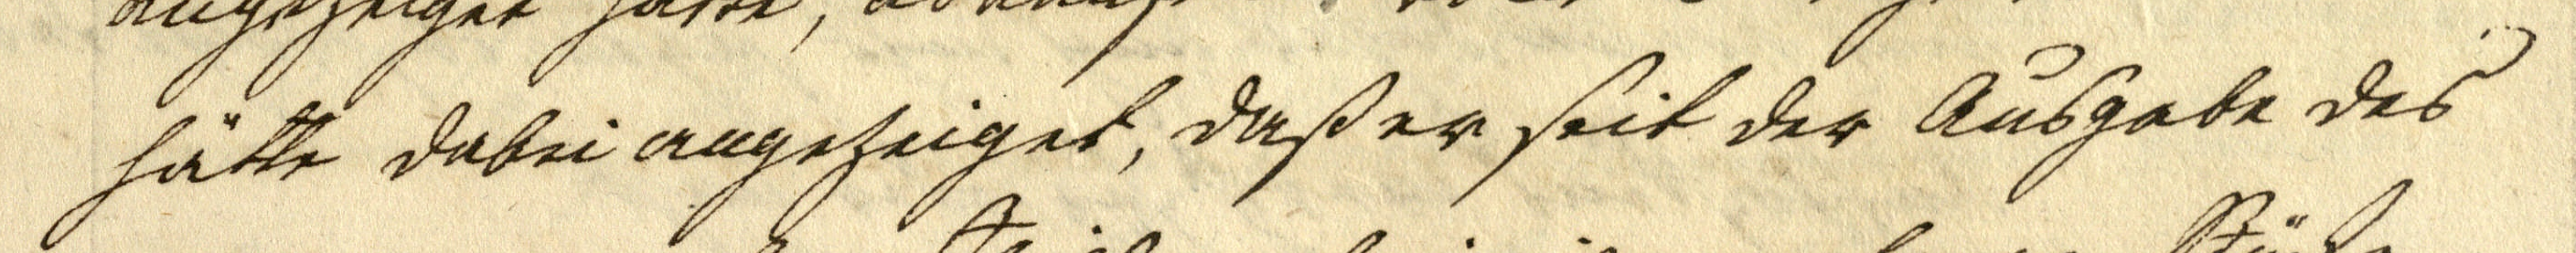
hätte dabei angezeiget, daß er seit der Ausgabe des
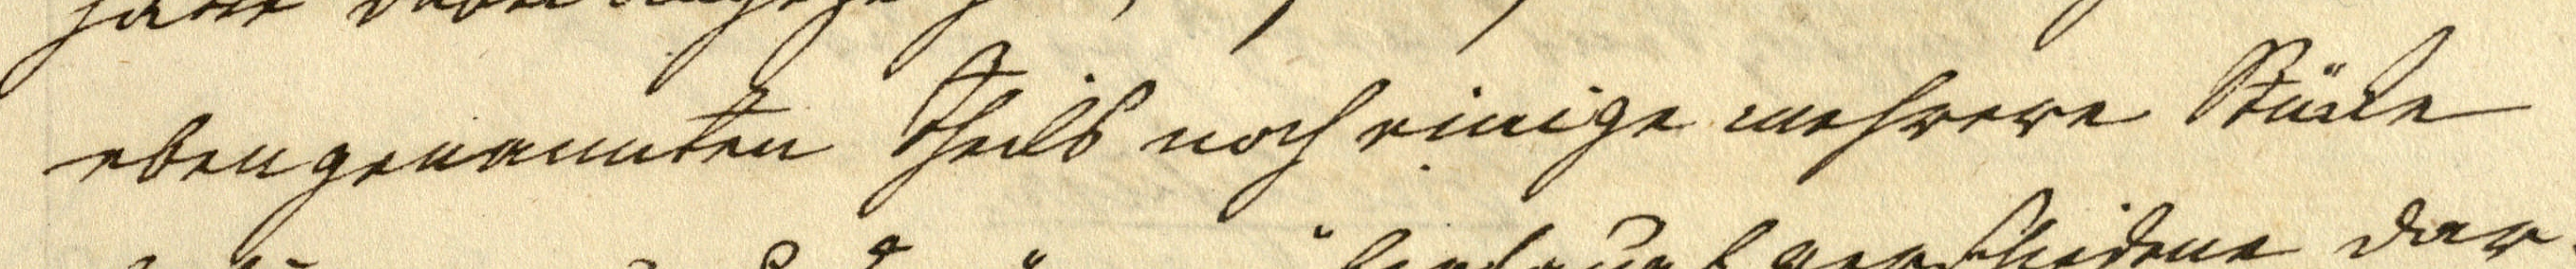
ebengenannten Theils noch einige mehrere Stücke
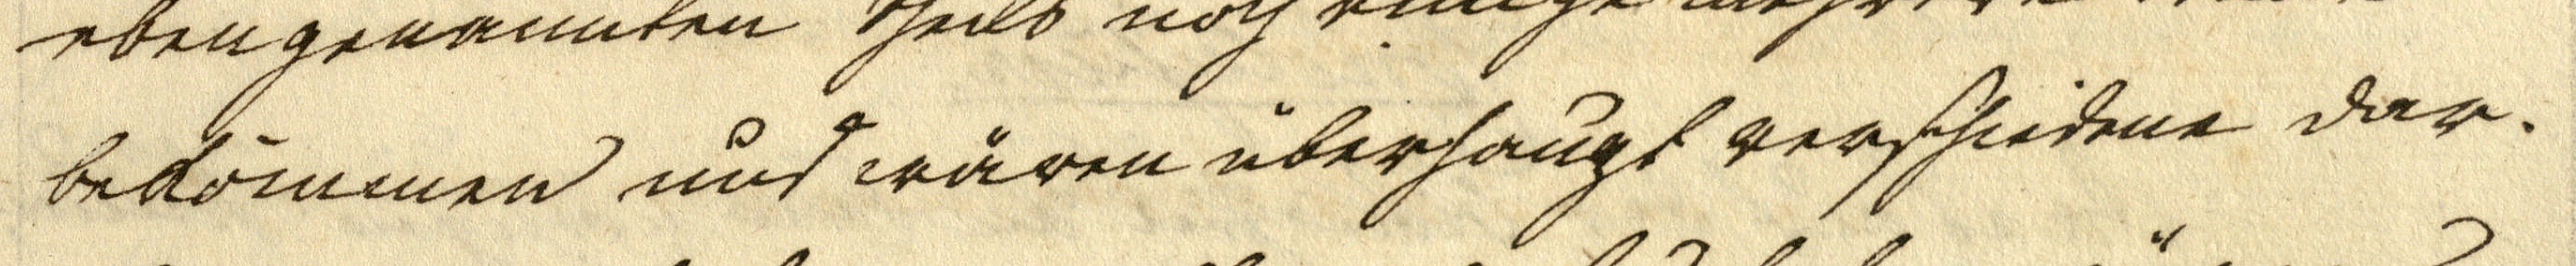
bekommen und wären überhaupt verschiedene dar-
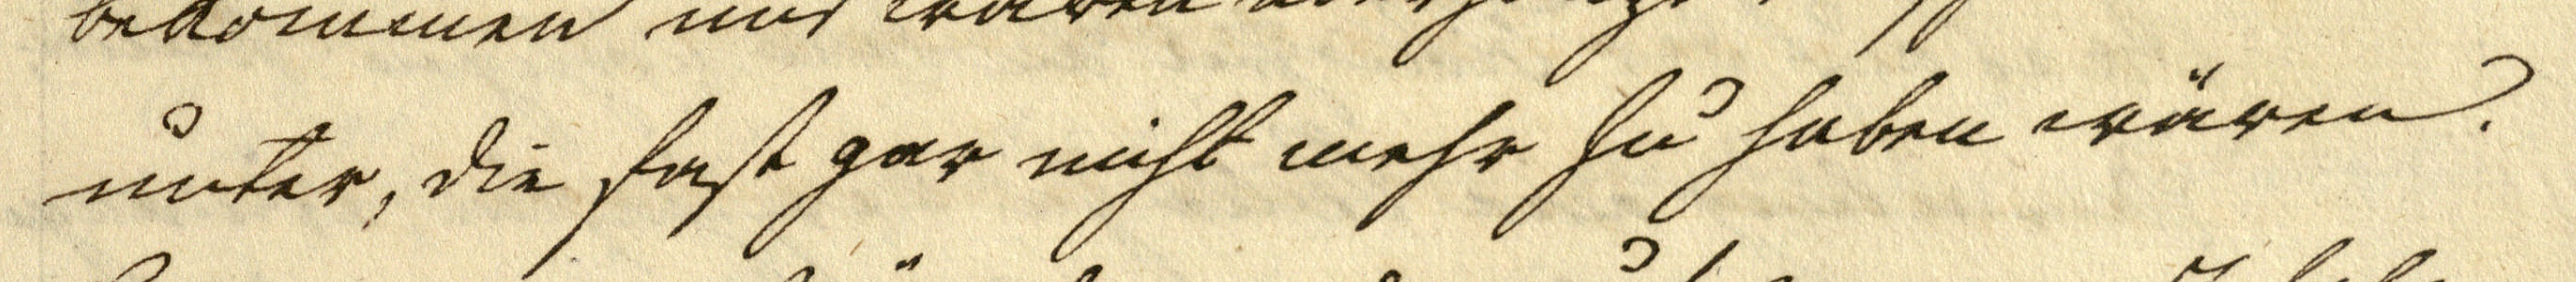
unter, die fast gar nicht mehr zu haben wären.
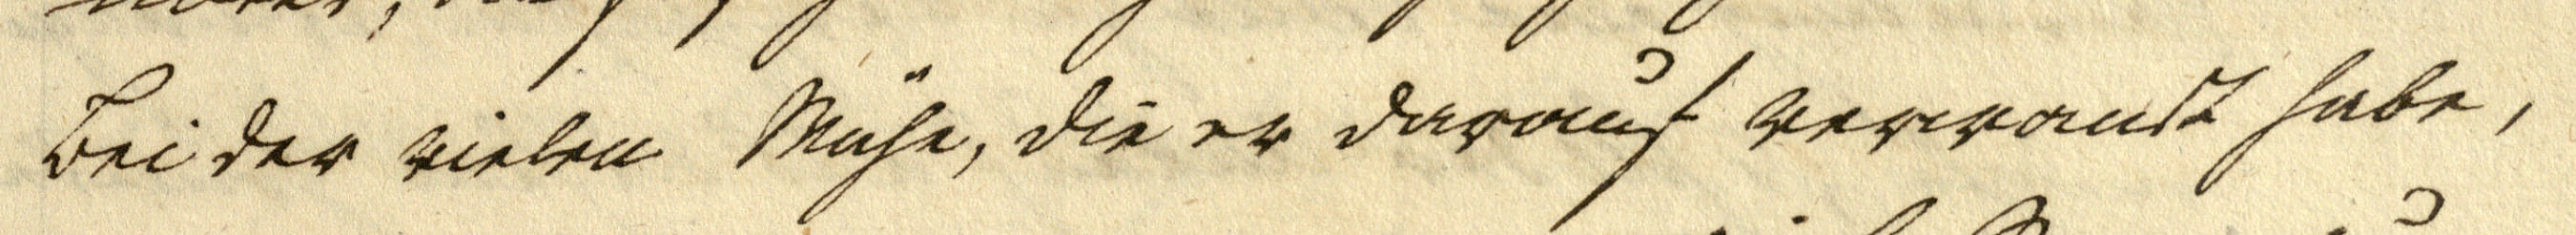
Bei der vielen Mühe, die er darauf verwandt habe,
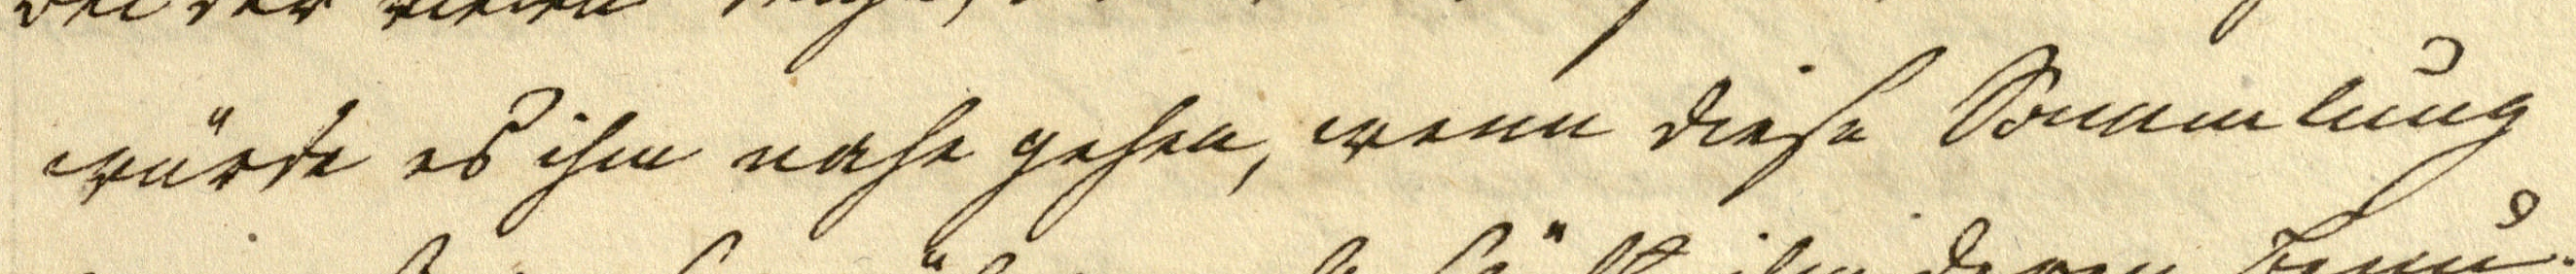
würde es ihm nahe gehen, wenn diese Sammlung
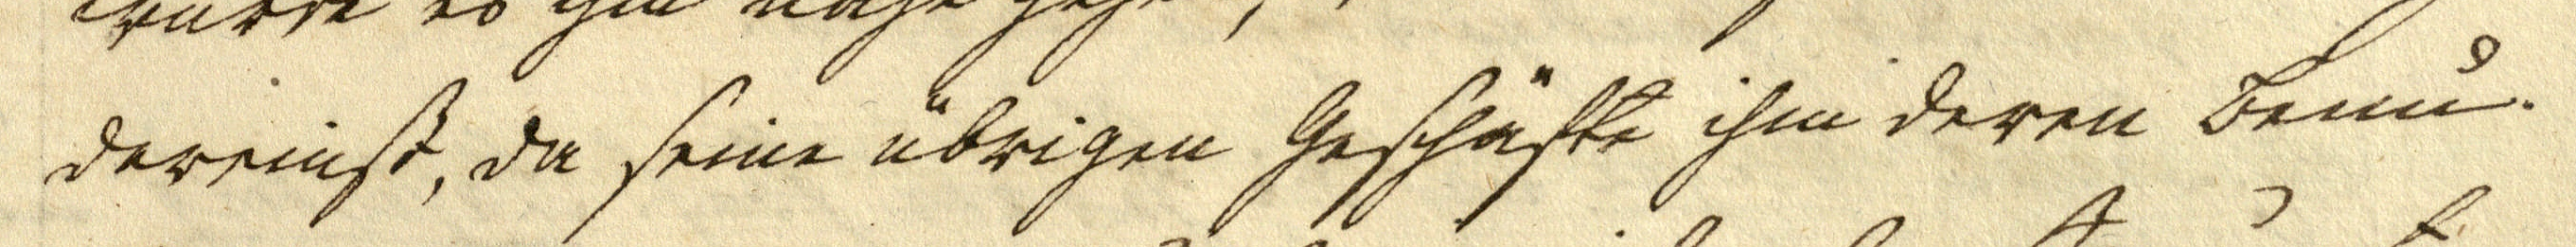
dereinst, da seine übrigen Geschäfte ihm deren Benu-
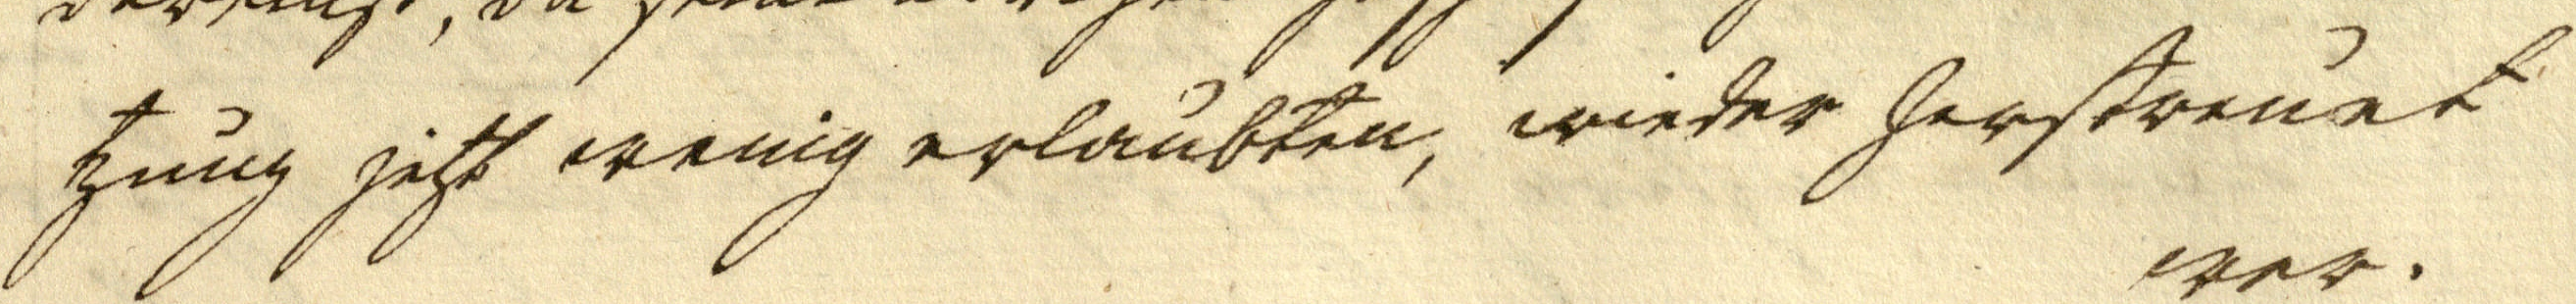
tzung jetzt wenig erlaubten, wieder zerstreuet
